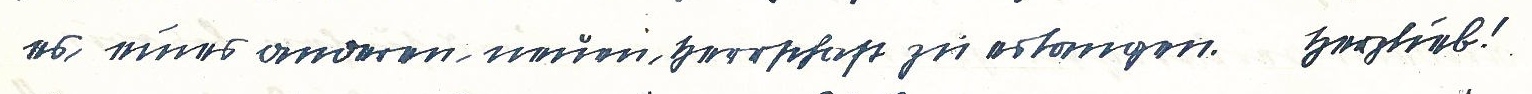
es, eines anderen, neuen, Herrschaft zu erlangen. Herzlieb!
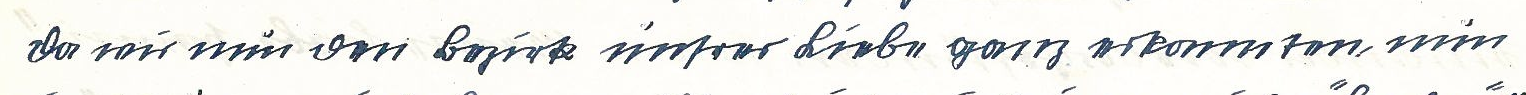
Da wir nun den Bezirk unsrer Liebe ganz erkannten, nun
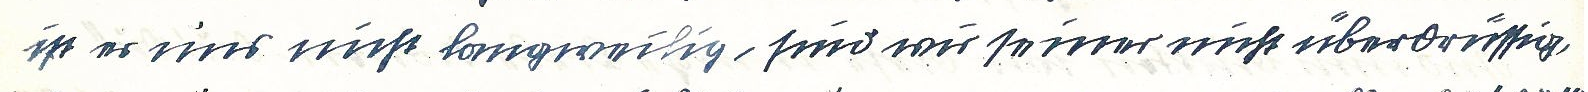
ist es uns nicht langweilig, sind wir seiner nicht überdrüssig,
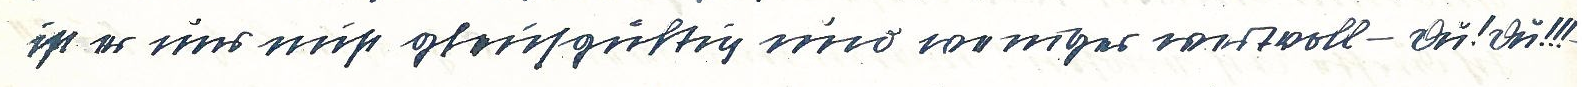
ist es uns nicht gleichgültig und weniger wertvoll – Du! Du!!!
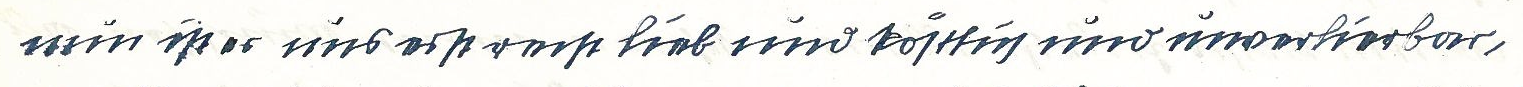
Nun ist es uns erst recht lieb und köstlich und unverlierbar,
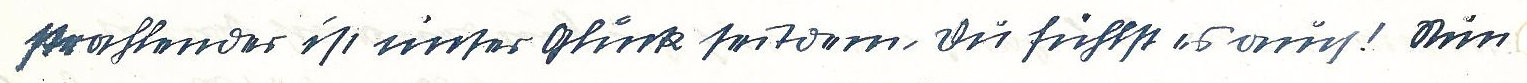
strahlender ist unser Glück seitdem, Du fühlst es auch! Nun
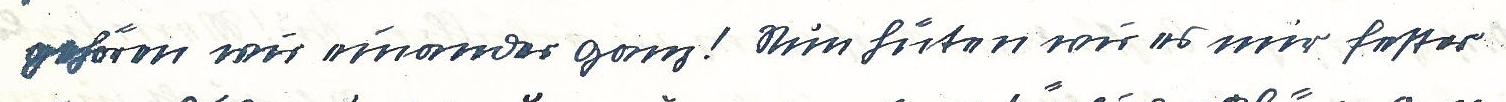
gehören wir einander ganz! Nun hüten wir es nur fester
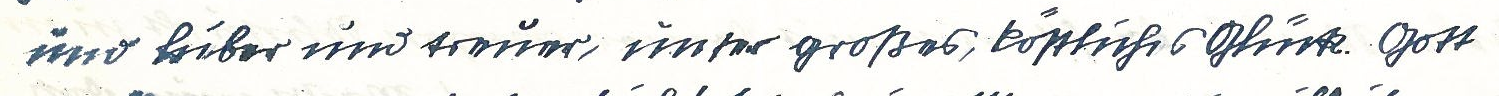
und lieber und treuer, unser großes, köstliches Glück. Gott
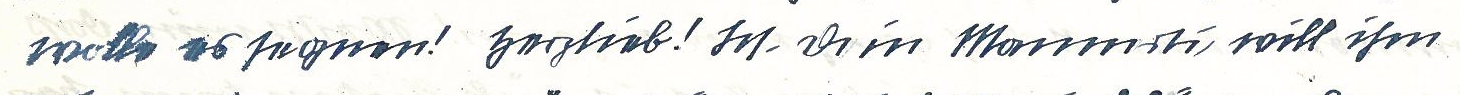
wolle es segnen! Herzlieb! Ich, Dein Mannerli, will ihm
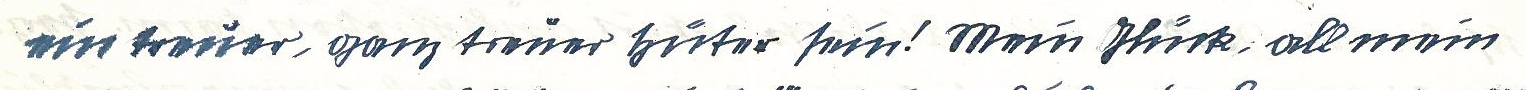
ein treuer, ganz treuer Hüter sein! Mein Glück, all mein
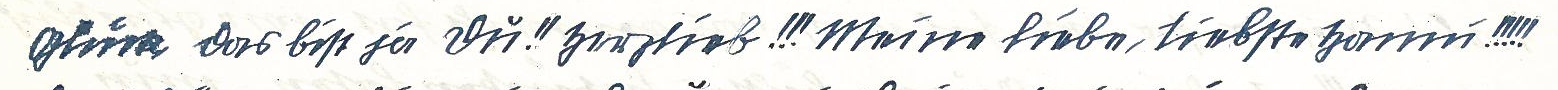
Glück, das bist ja Du!! Herzlieb!!! Meine liebe, liebste !!!!!
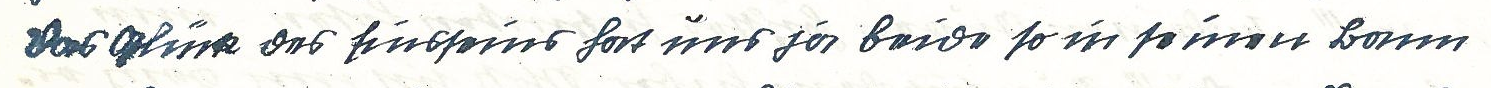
Das Glück des Einsseins hat uns ja beide so in seinen Bann
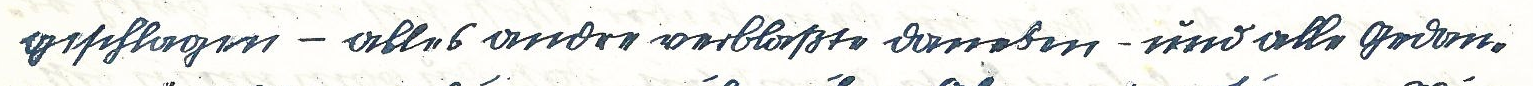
geschlagen – alles andre verblaßte daneben – und alle Gedan¬
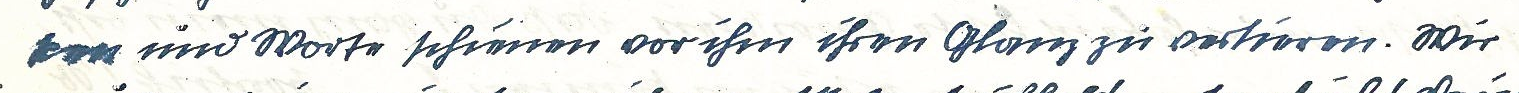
ken und Worte schienen vor ihm ihren Glanz zu verlieren. Wir
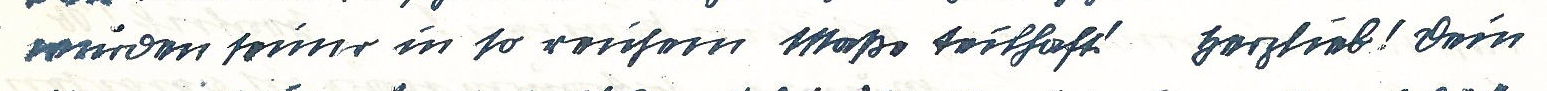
wurden seiner in so reichem Maße teilhaft! Herzlieb! Dein
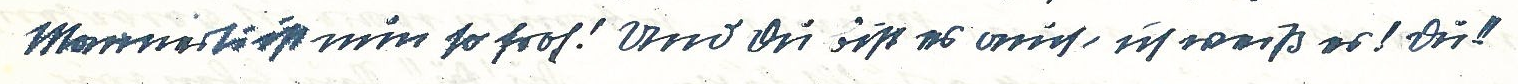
Mannerli ist nun so froh! Und Du bist es auch, ich weiß es! Du!!
